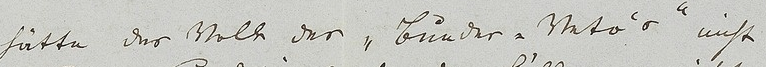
hätte das Volk des «Bundes-Veto's» nicht
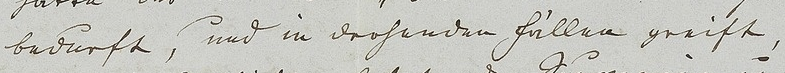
bedurft, und in drohenden Fällen greift,
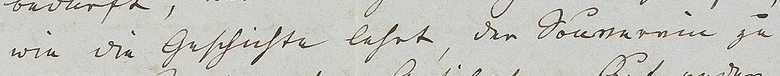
wie die Geschichte lehrt, der Souverain zu
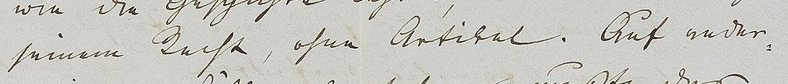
seinem Recht, ohne Artikel. Auf ander-
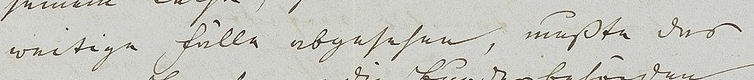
weitige Fälle abgesehen, mußte das
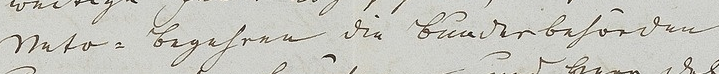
Veto-Begehren die Bundesbehörden
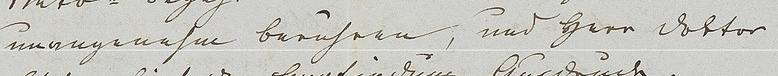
unangenehm berühren, und Herr Doktor
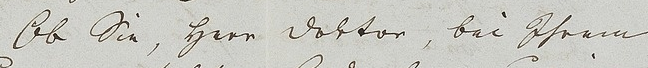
Ob Sie, Herr Doktor, bei Ihrem
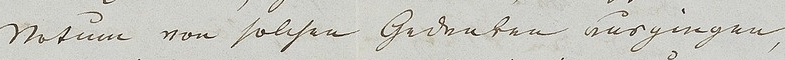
Votum von solchen Gedanken ausgingen,
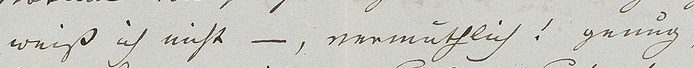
weiß ich nicht –, vermutlich! – genug,
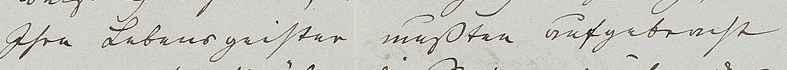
Ihre Lebensgeister mußten aufgebracht
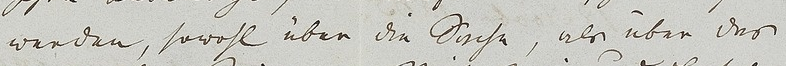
werden, sowohl über die Sache, als über das
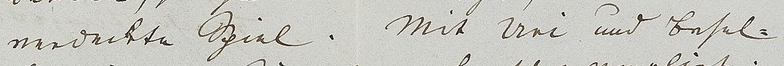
verdeckte Spiel. Mit Uri und Basel-
